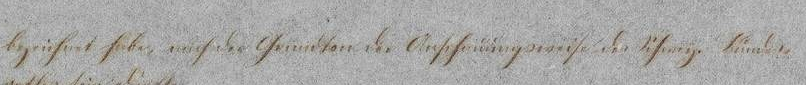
bezeichnet habe, auch der Grundton der Anschauungsweise des Schweiz. Bundes-
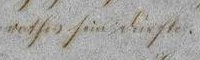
rathes sein dürfte.
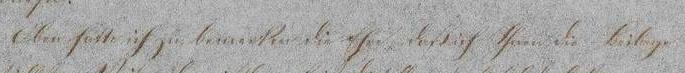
Oben hatte ich zu bemerken die Ehre, dass ich Ihnen die Beilage
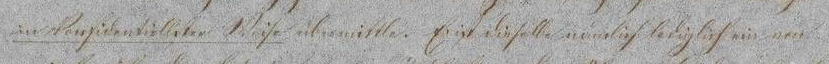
in konfidentiellster Weise übermittle. Es ist dieselbe nämlich lediglich ein von
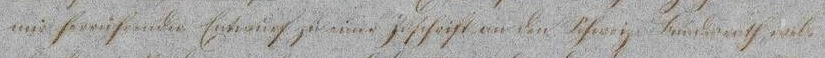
mir herrührender Entwurf zu einer Zuschrift an den Schweiz. Bundesrath, wel-
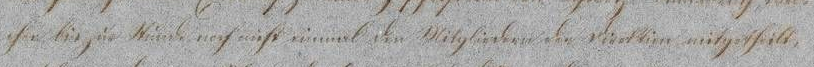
cher bis zur Stunde noch nicht einmal den Mitgliedern der Direktion mitgetheilt,
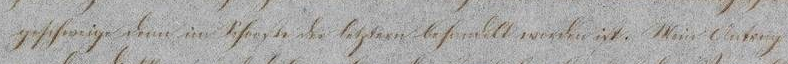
geschweige denn im Schooße der letztern behandelt worden ist. Mein Antrag
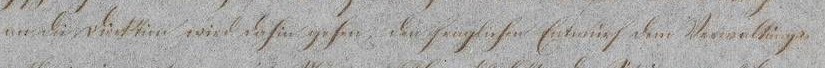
an die Direktion wird dahin gehen, den fraglichen Entwurf dem Verwaltungs-
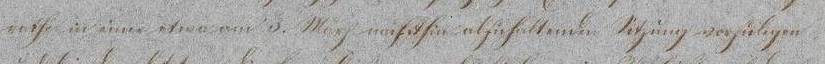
rathe in einer etwa am 3. März nächsthin abzuhaltenden Sitzung vorzulegen
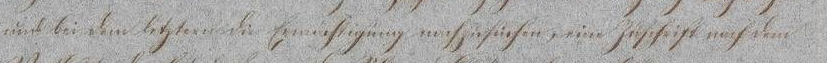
und bei dem letztern die Ermächtigung nachzusuchen, eine Zuschrift nach dem
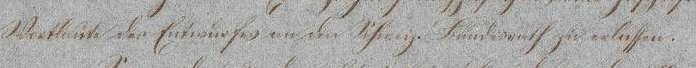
Wortlaute des Entwurfs an den Schweiz. Bundesrath zu erlassen.
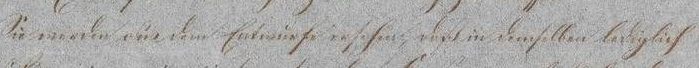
Sie werden aus dem Entwurfe ersehen, dass in demselben lediglich
